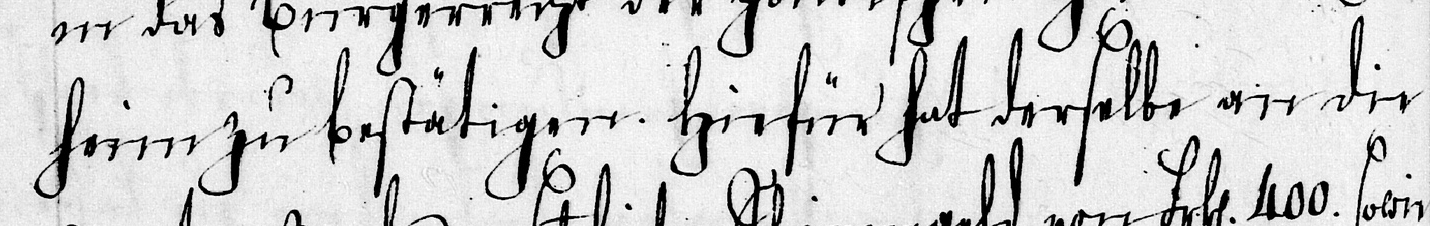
theim zu bestätigen. Hiefür hat derselbe an die
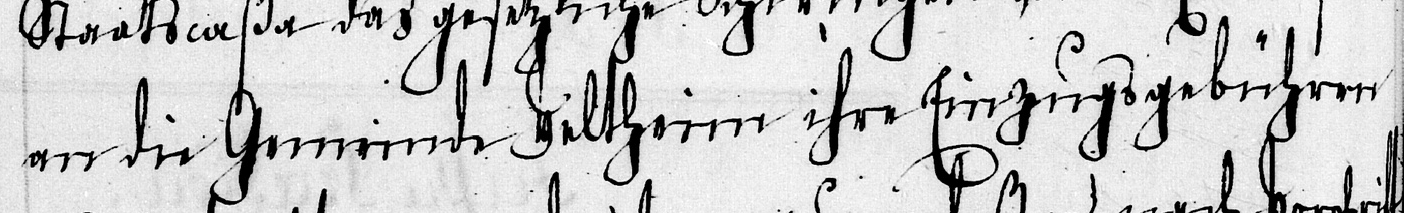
an die Gemeinde Veltheim ihre Einzugsgebühren
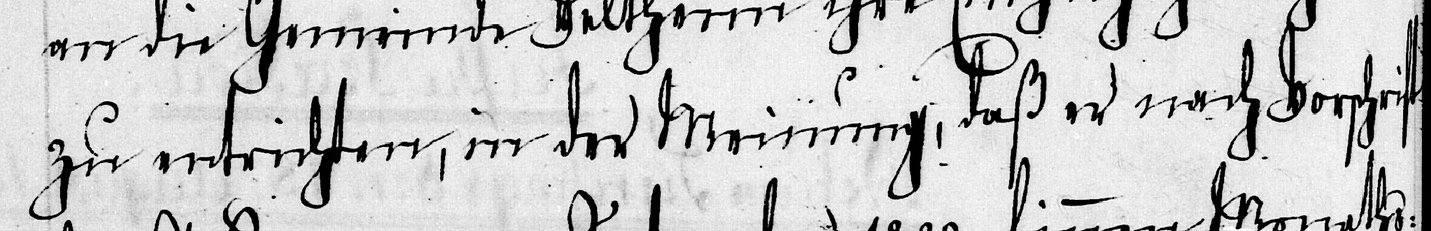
zu entrichten, in der Meinung, daß er nach Vorschr¬
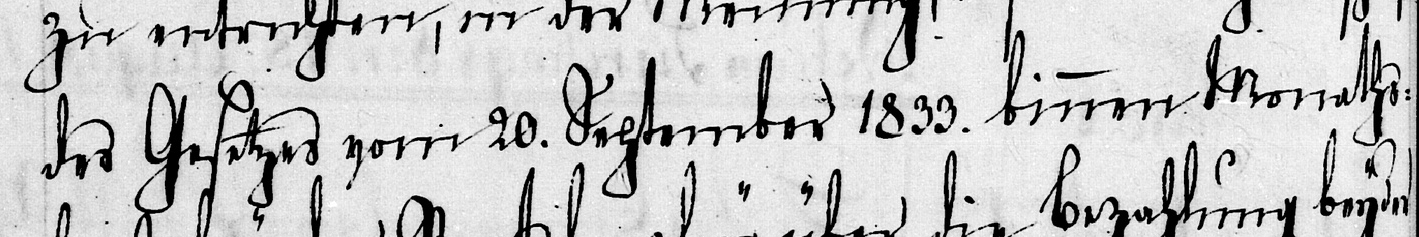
des Gesetzes vom 20. September 1833. binnen Monaths¬
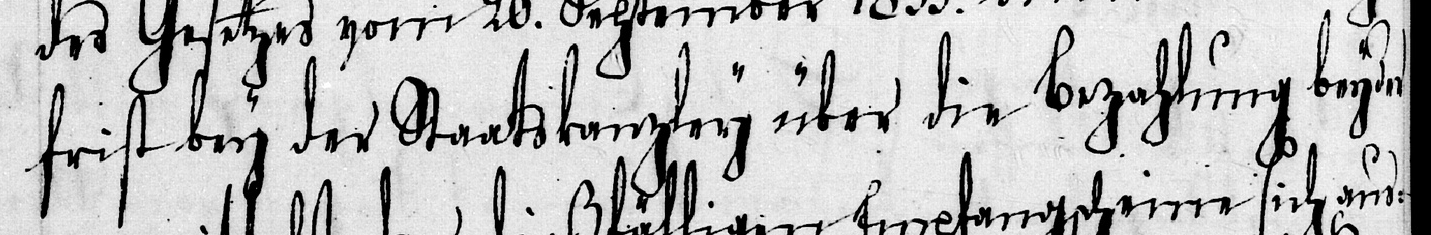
frist bey der Staatskanzley über die Bezahlung beyder
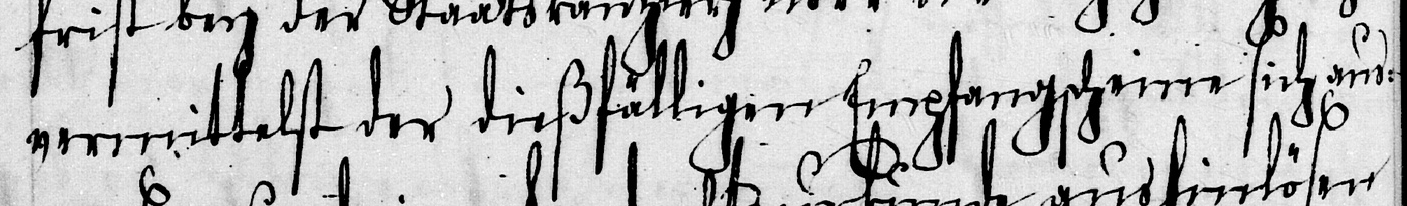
vermittelst der dießfälligen Empfangscheine sich a¬
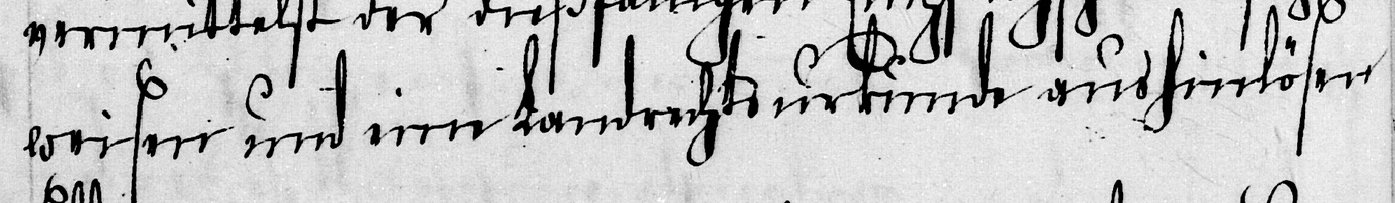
weisen und eine Landrechtsukrunde aushinlösen
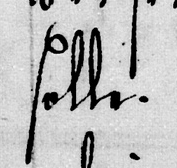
le.
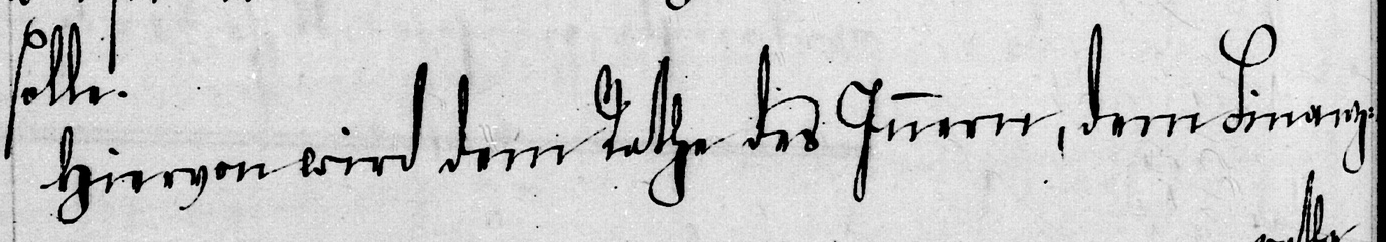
Hiervon wird dem Rathe des Innern, dem Finanz-
